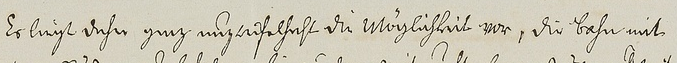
Es liegt daher ganz unzweifelhaft die Möglichkeit vor, die Bahn mit
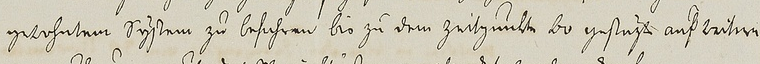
gewohntem System zu befahren bis zu dem Zeitpunkte wo gestüzt auf weitere
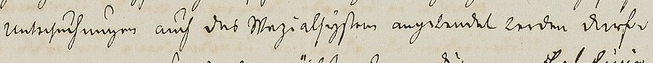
Untersuchungen auch das Spezialsystem angewendet werden darf.
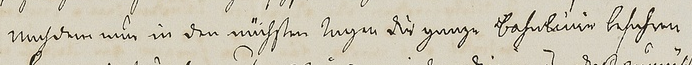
Nachdem nun in den nächsten Tagen die ganze Bahnlinie befahren
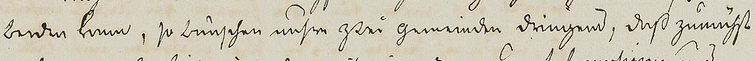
werden kann, so wünschen unsere zwei Gemeinden dringend, daß zunächst
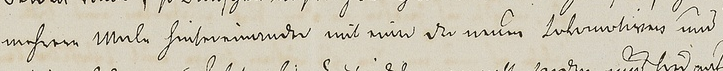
mehrere Male hintereinader mit einer der neuen Lokomotiven und
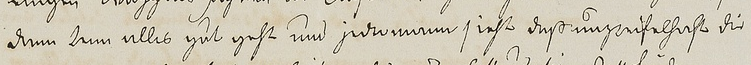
dann wenn alles gut geht und jedermann sieht daß unzweifelhaft die
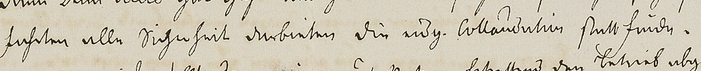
Fahrten alle Sicherheit darbieten die eidg. Collaudation statt finde.
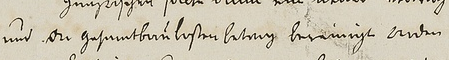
und der Gesamtbaukostenbetrag bereinigt werden.
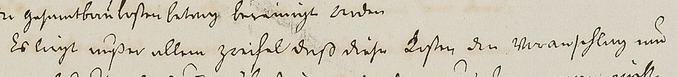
Es liegt außer allem Zweifel daß diese Kosten den Voranschlag um
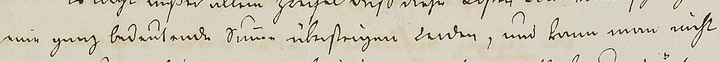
eine ganz bedeutende Summe übersteigen werden, und kann man nicht
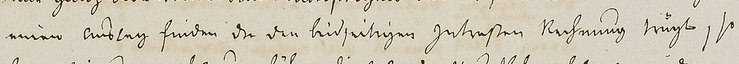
einen Ausweg finden der den beidseitigen Intressen Rechnung trägt, so
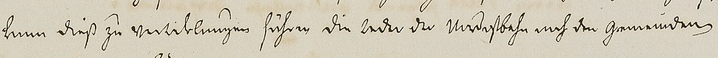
kann dieß zu Verwiklungen führen die weder der Nordostbahn noch den Gemeinden
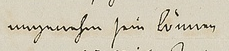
angenehm sein können.
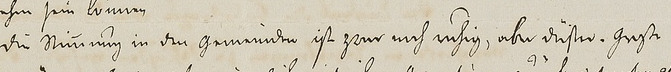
Die Stimmung in den Gemeinden ist zwar noch ruhig, aber düster. Große
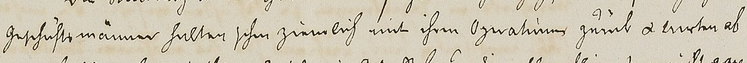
Geschäftsmänner halten schon ziemlich mit Ihren Operationen zurük & warten ab
